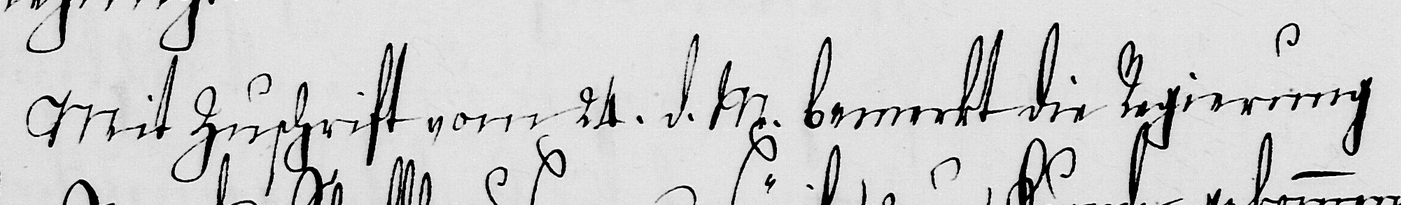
Mit Zuschrift vom 24. d. M. bemerkt die Regierung
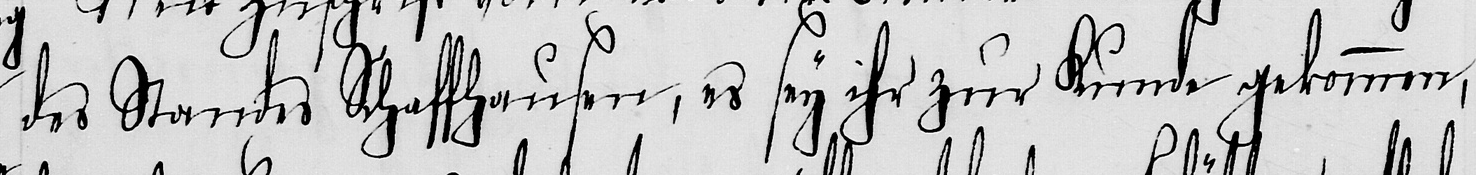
des Standes Schaffhausen, es sey ihr zur Kunde gekommen,
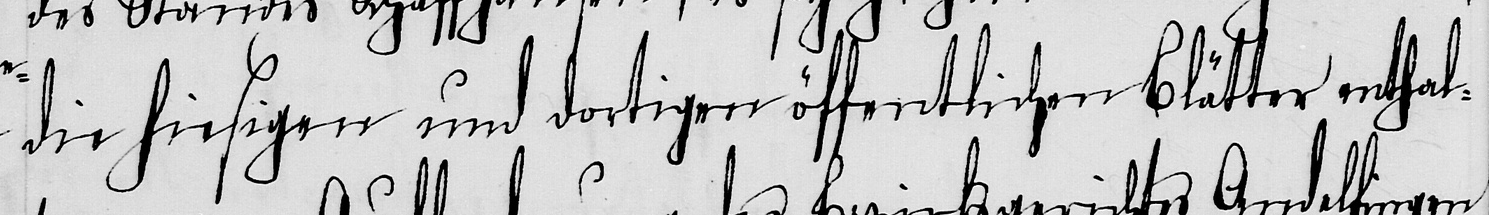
die hiesigen und dortigen öffentlichen Blätter enthal¬
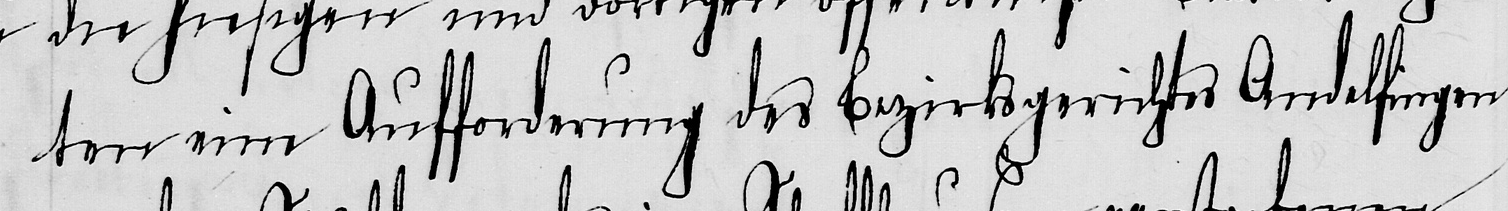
ten eine Aufforderung des Bezirksgerichtes Andelfing¬
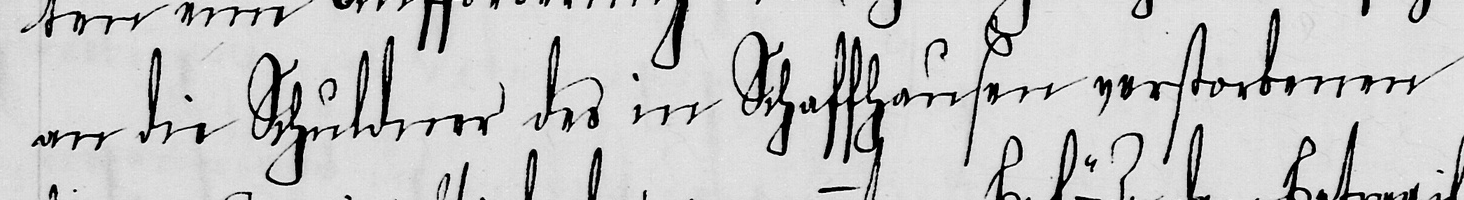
an die Schuldner des in Schaffhausen verstorbenen
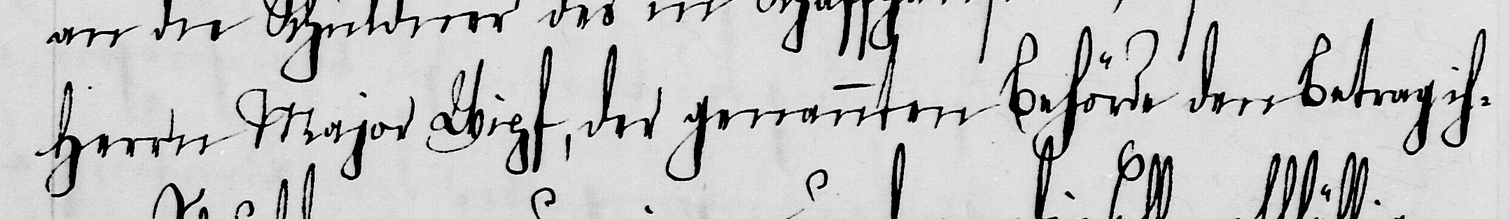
Herrn Major Wipf, der genannten Behörde den Betrag ih¬
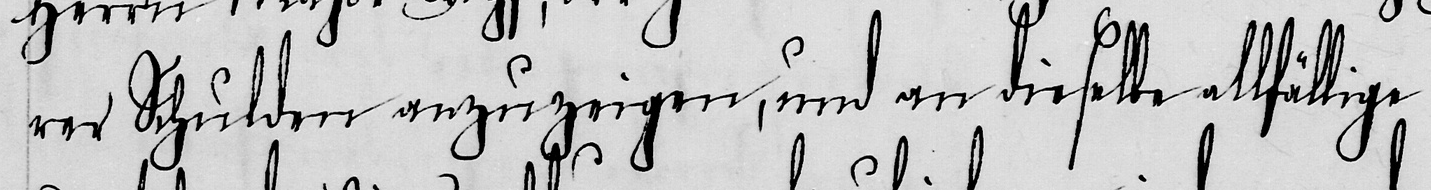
rer Schulden anzuzeigen, und an dieselbe allfälli¬
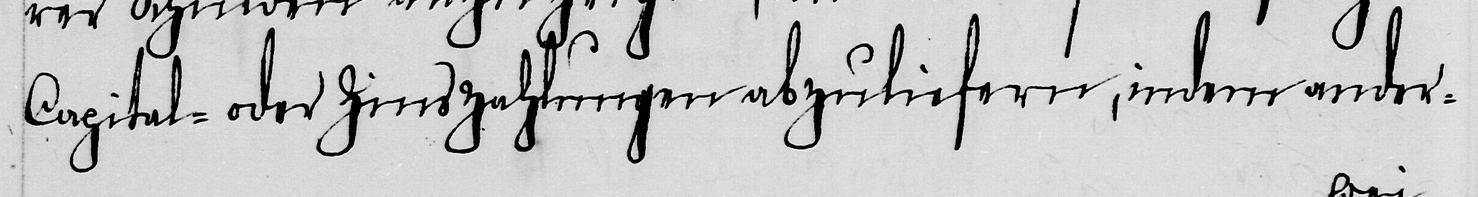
Capital- oder Zinszahlung abzuliefern, indem ander-
